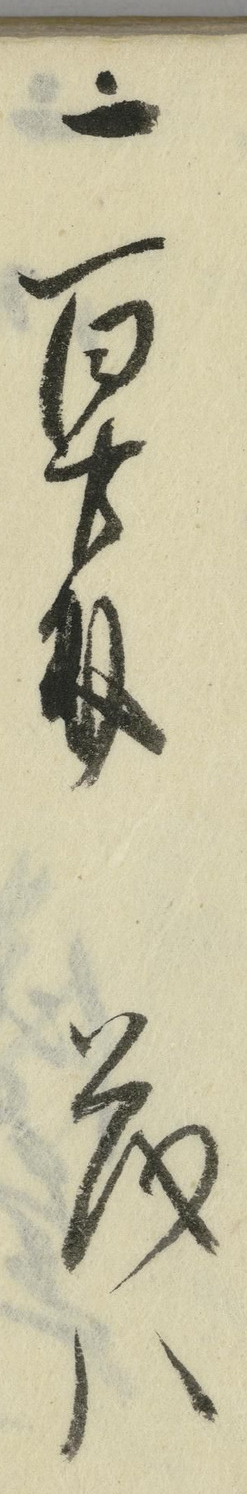一百廿文茂八
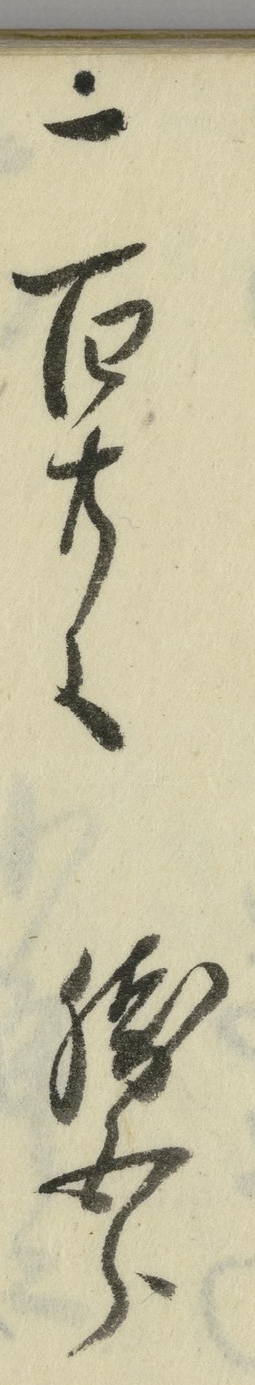一百廿文勝五郎
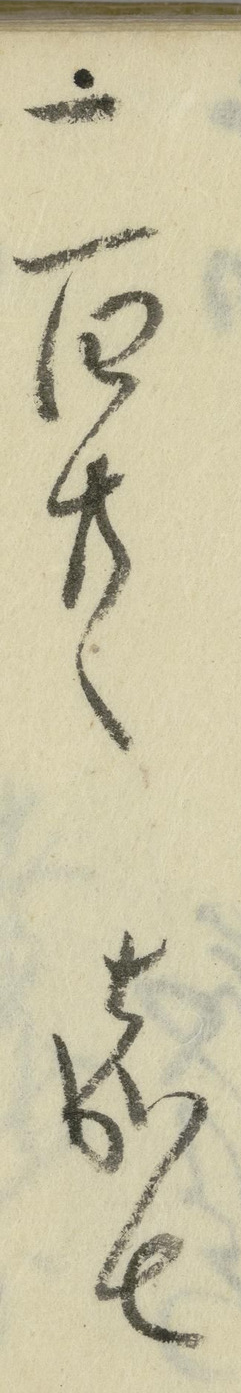一百廿文茂八
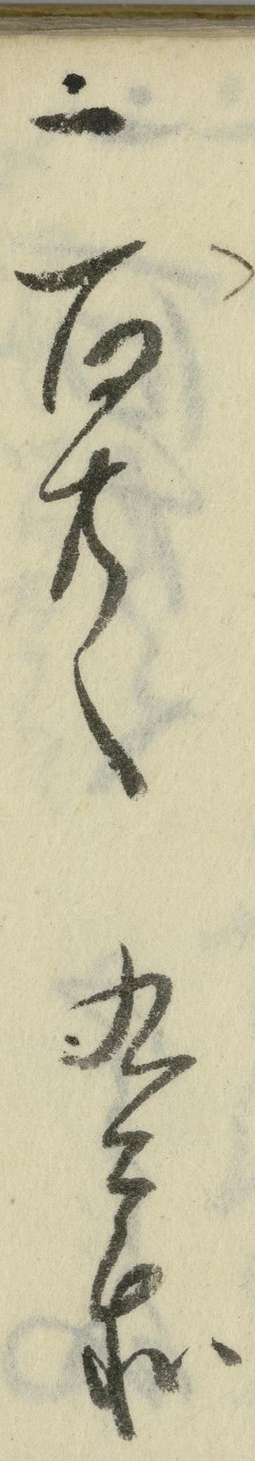一百廿文九兵衛
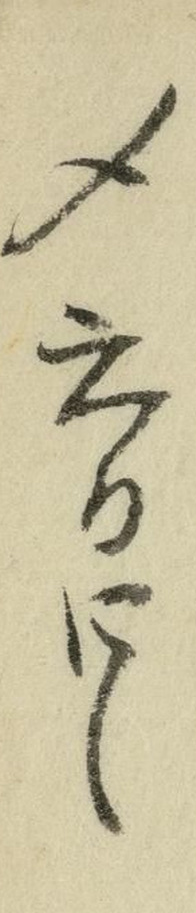〆六百四文

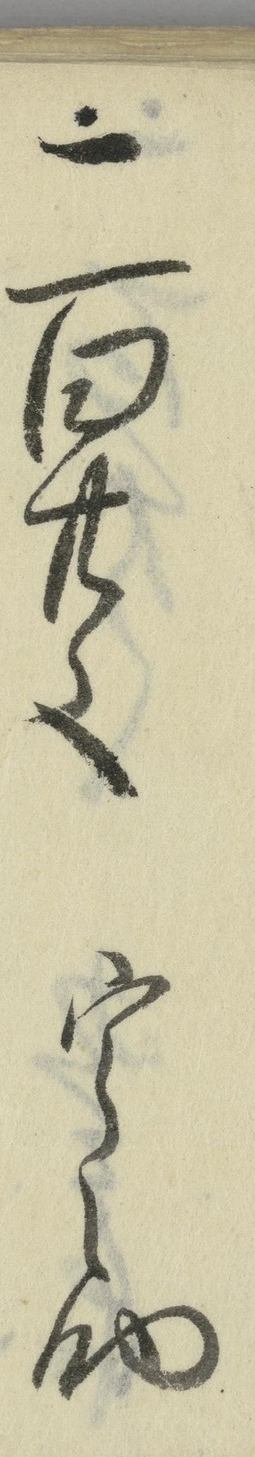一百廿文宇之助
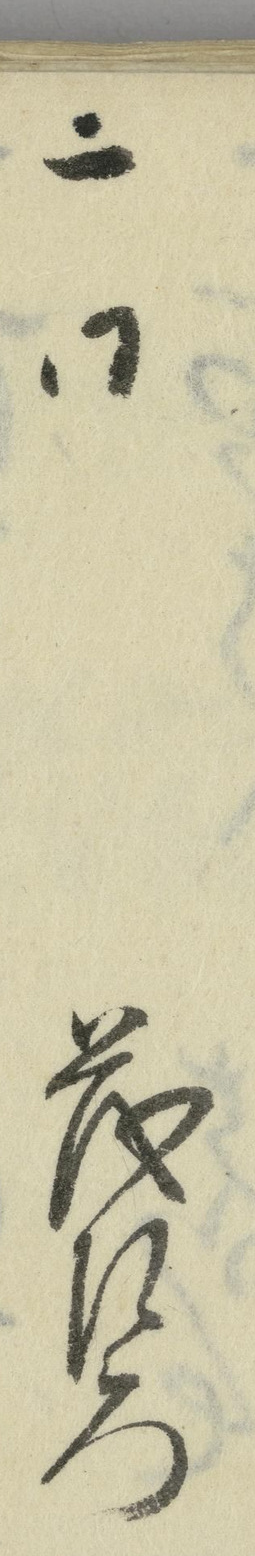一同茂左衛門
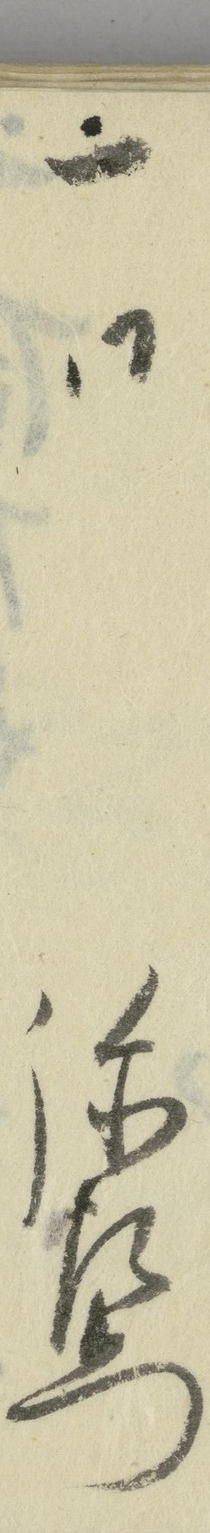一同弥左衛門
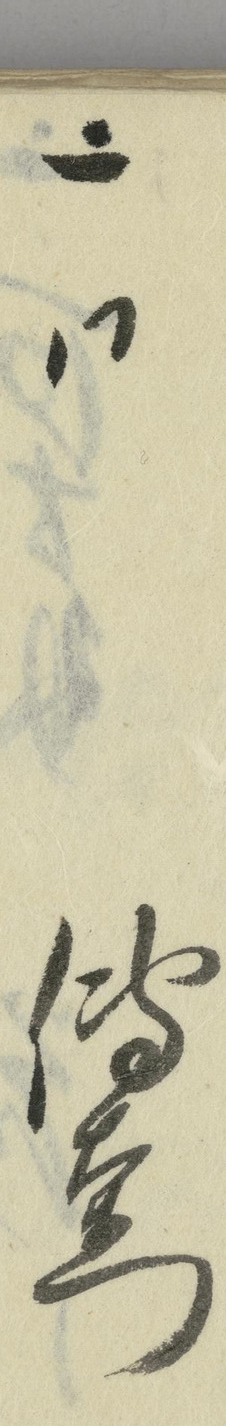一同伝右衛門
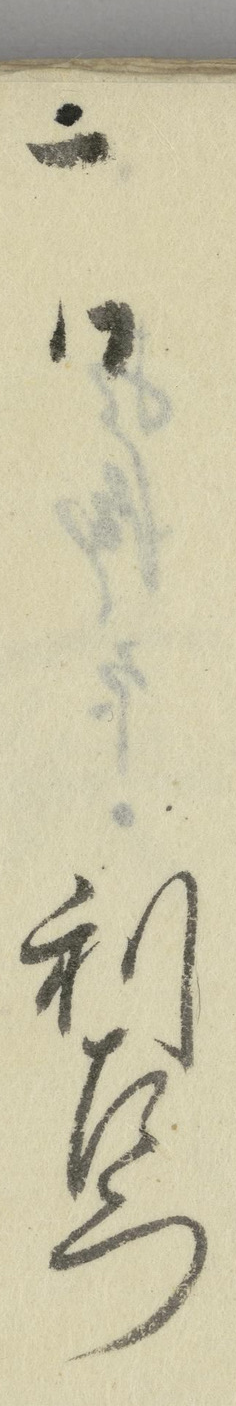一同利左衛門
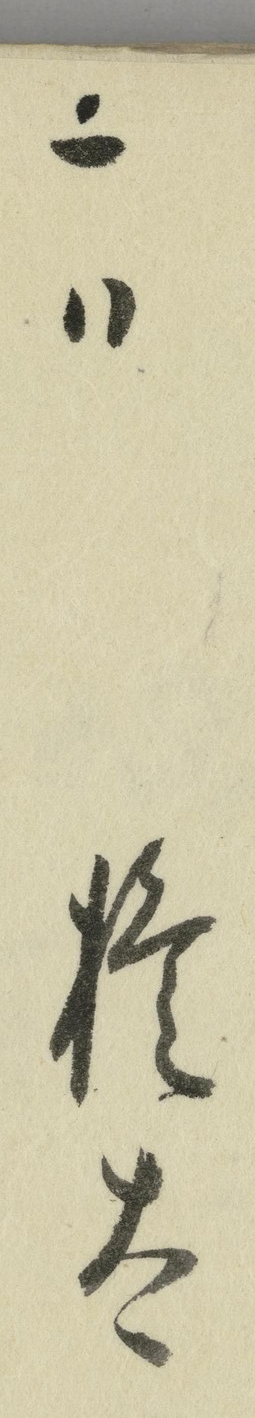一同権太
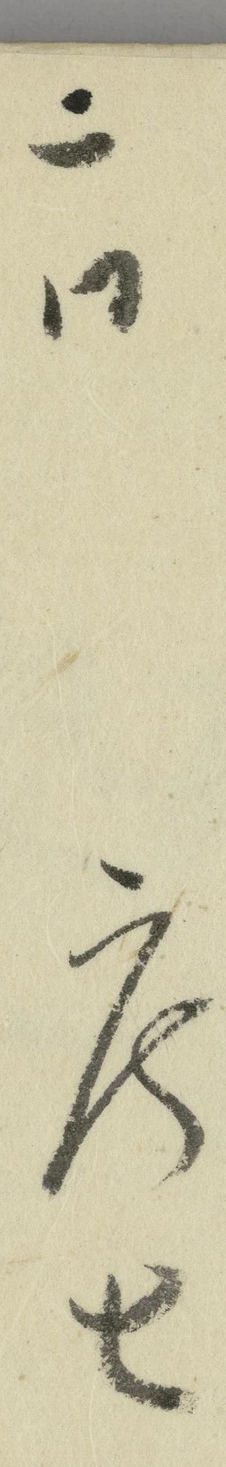一同庄七
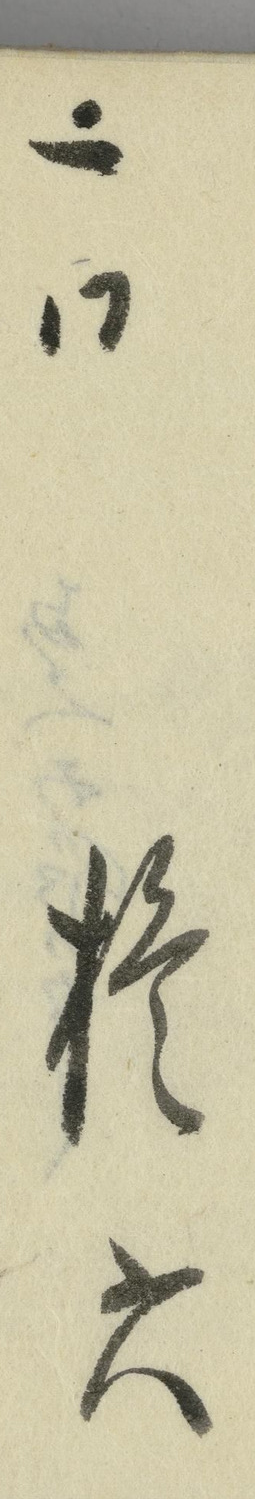一同権六
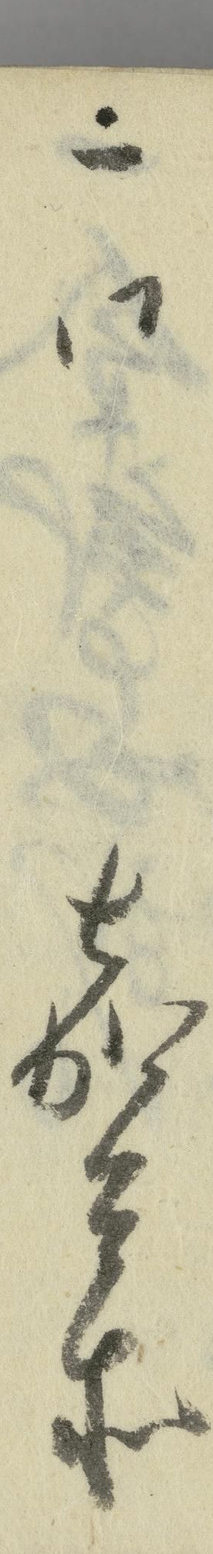一同嘉兵衛
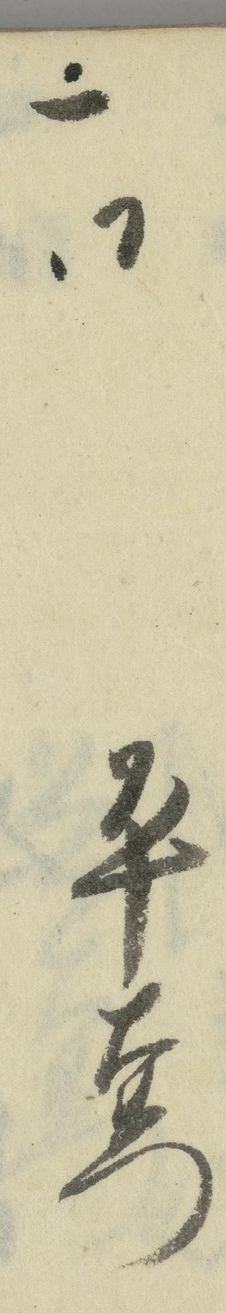一同伝右衛門
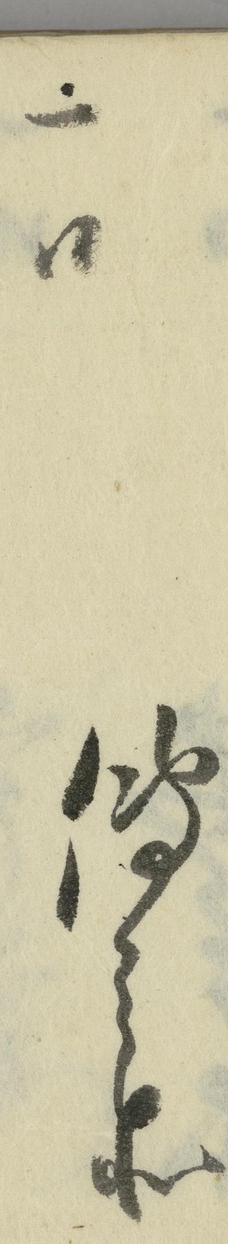一同嘉兵衛
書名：天明淺間噴火ニ関スル書類
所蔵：東京大学地震研究所図書室 Earthquake Research Institute Library, The University of Tokyo, JAPAN
